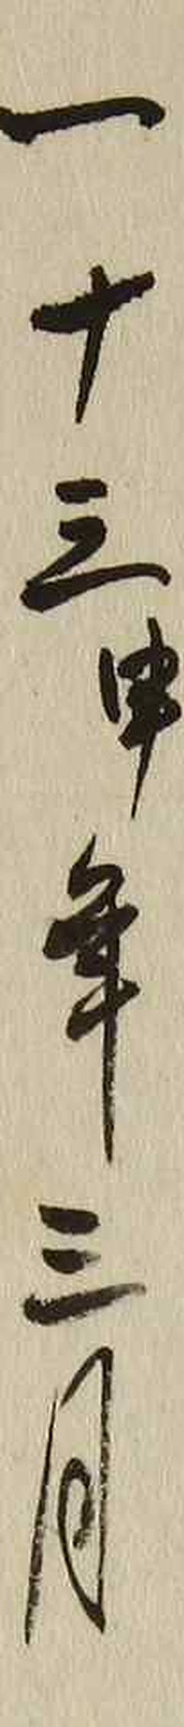一十三申年三月
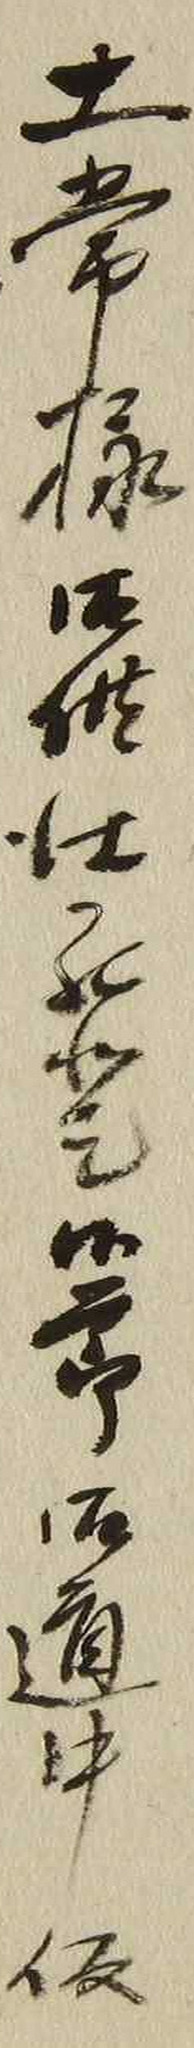土常様御供仕罷登候節御道中仮
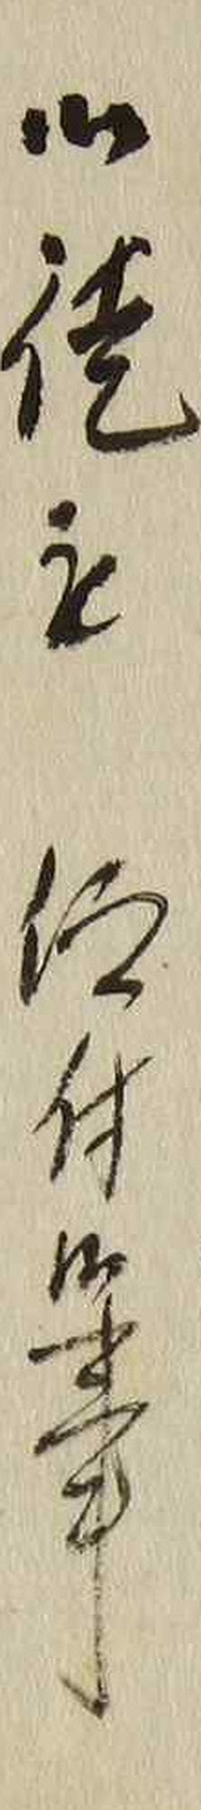御徒被仰付候事
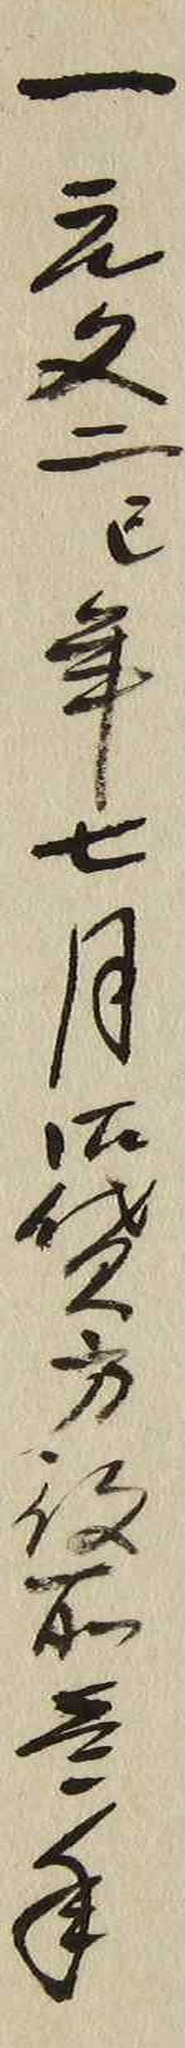一元文二巳年七月御貸方役所壱年
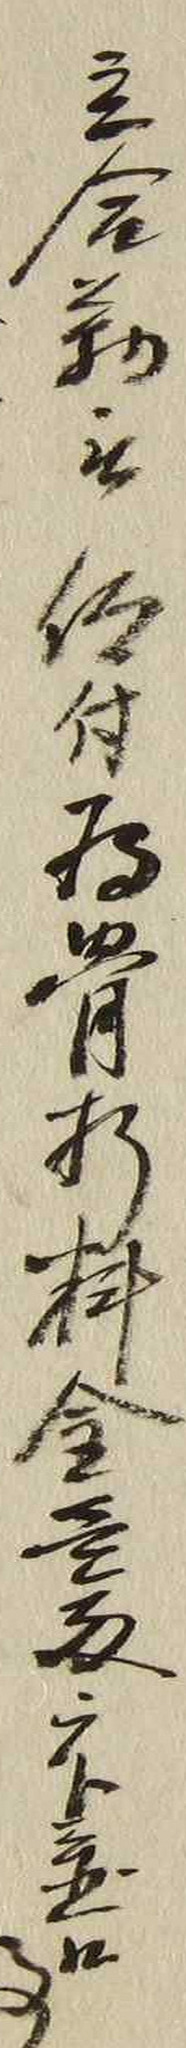立合勤被仰付為骨折料金壱両被下置候事
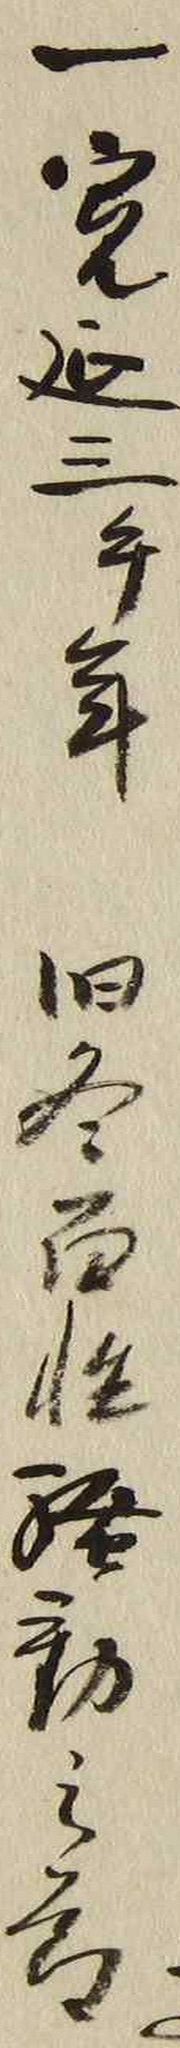一寛延三午年旧冬百姓騒動之節
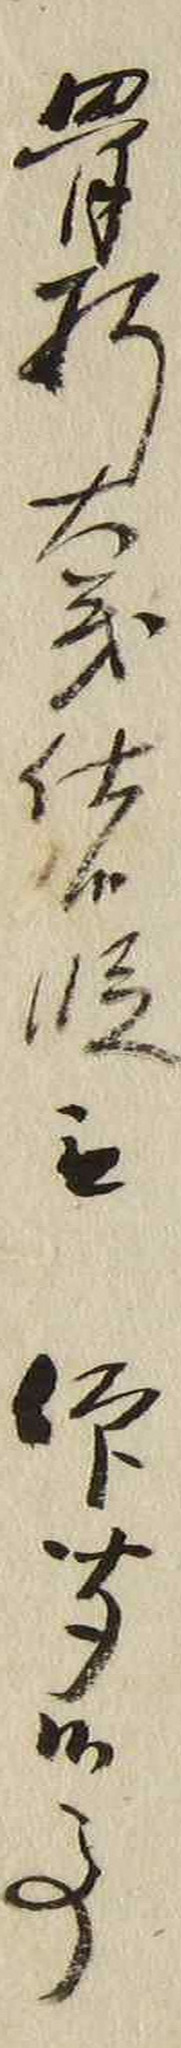骨折大義仕候段被仰聞候事
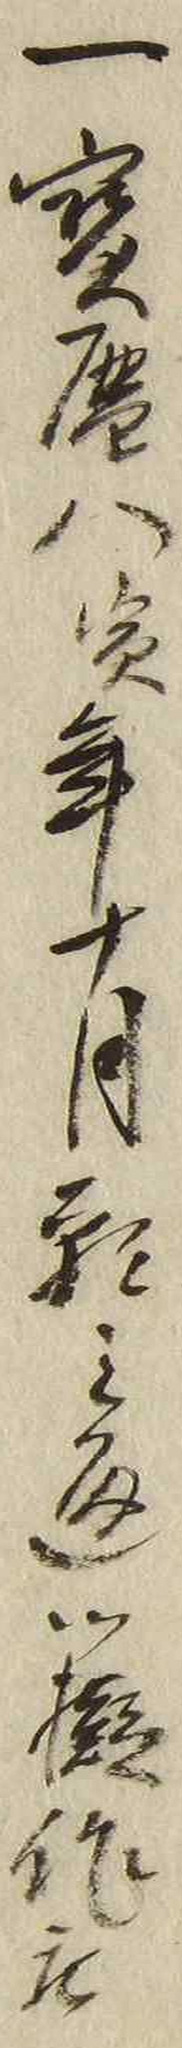一宝暦八寅年十月願之通御擬作被

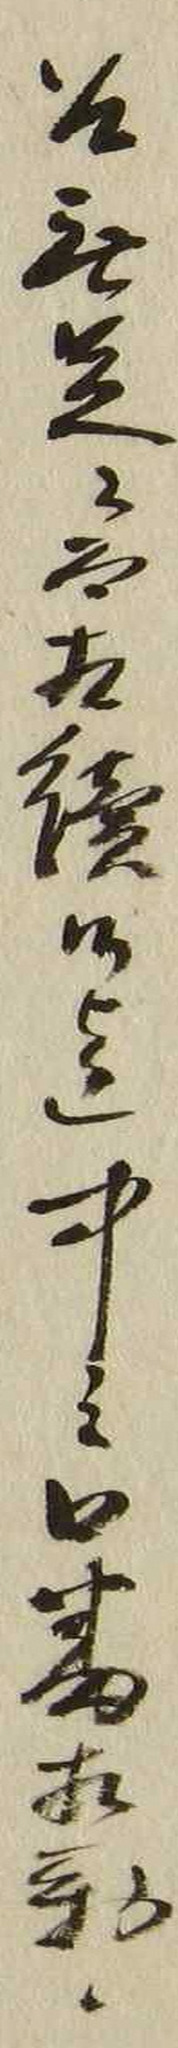召無足に而相続候迄中之口番相勤候
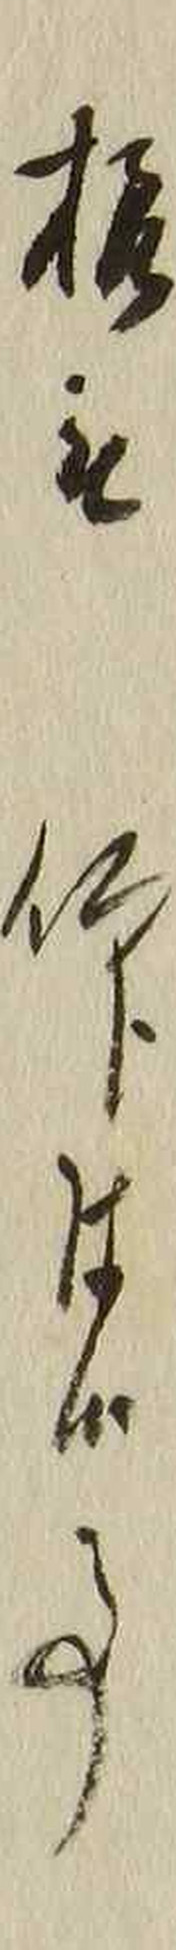様被仰付候事
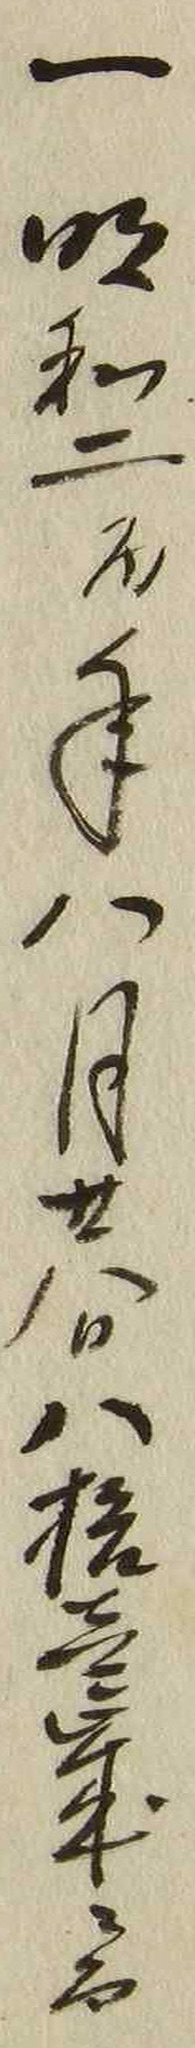一明和二酉年八月廿八日八拾壱年歳ニ而
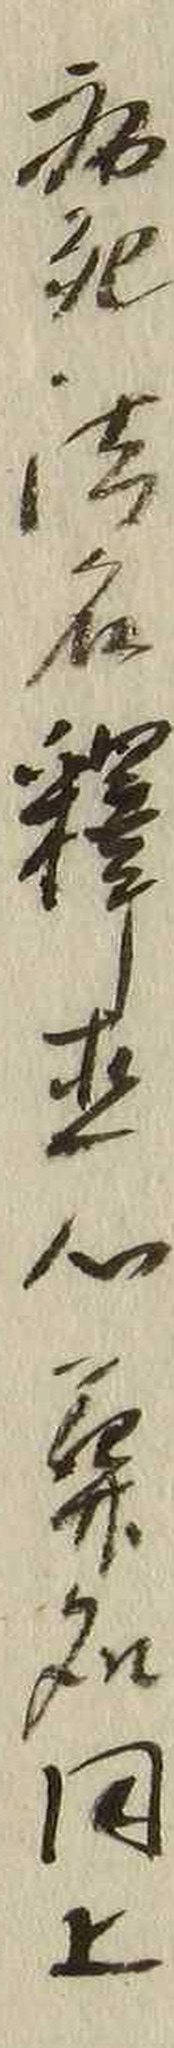病死法名釈直心葬処同上
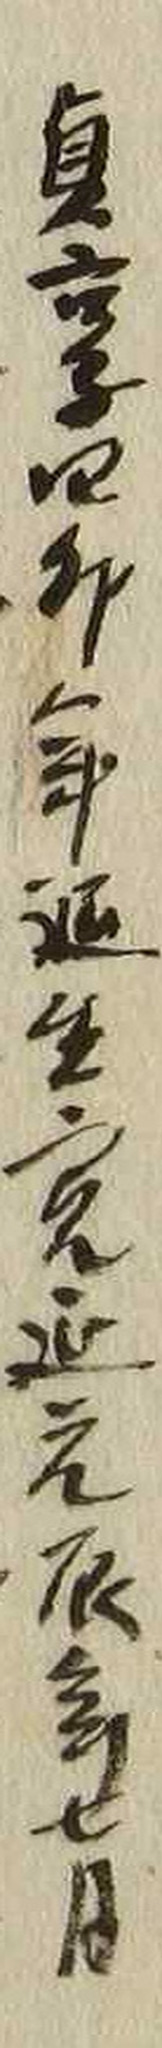貞享四卯年誕生寛延元辰年七月
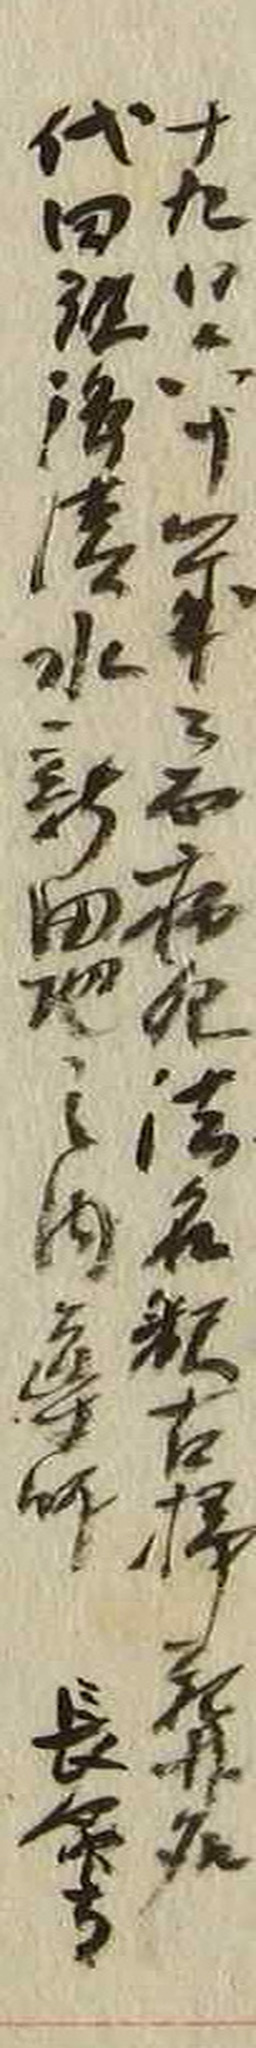母同上代田組強清水新田地之内導師長命寺
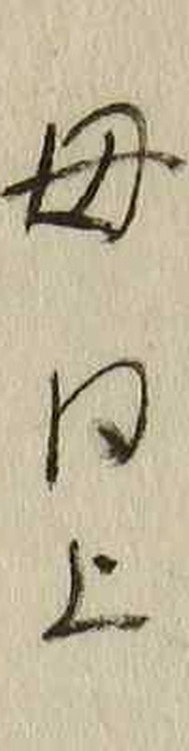母同上
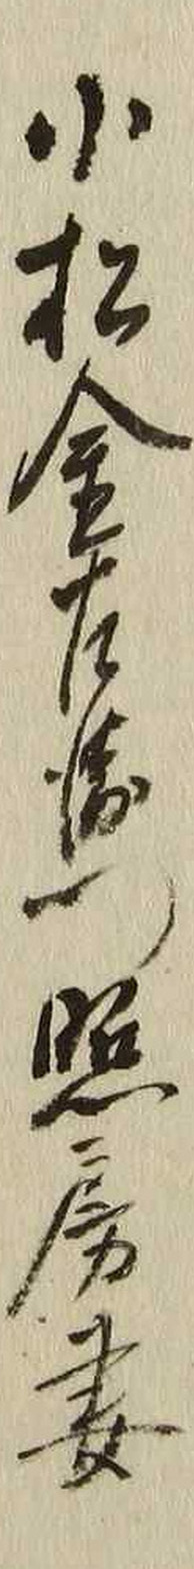女小松金左衛門照房妻
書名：諸士系譜　巻之360　す之部10
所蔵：会津若松市立会津図書館
